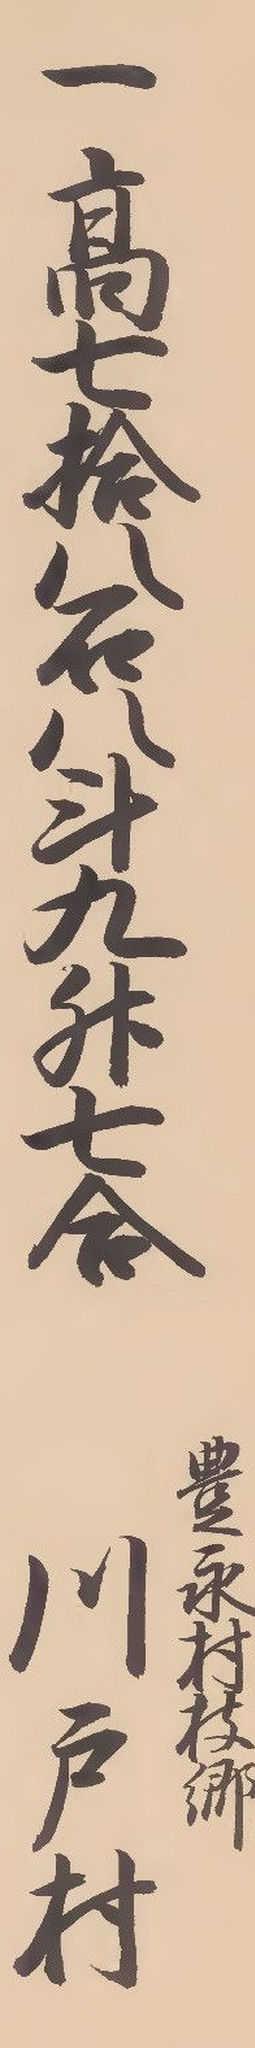一髙七拾八石八斗九升七合川戸村
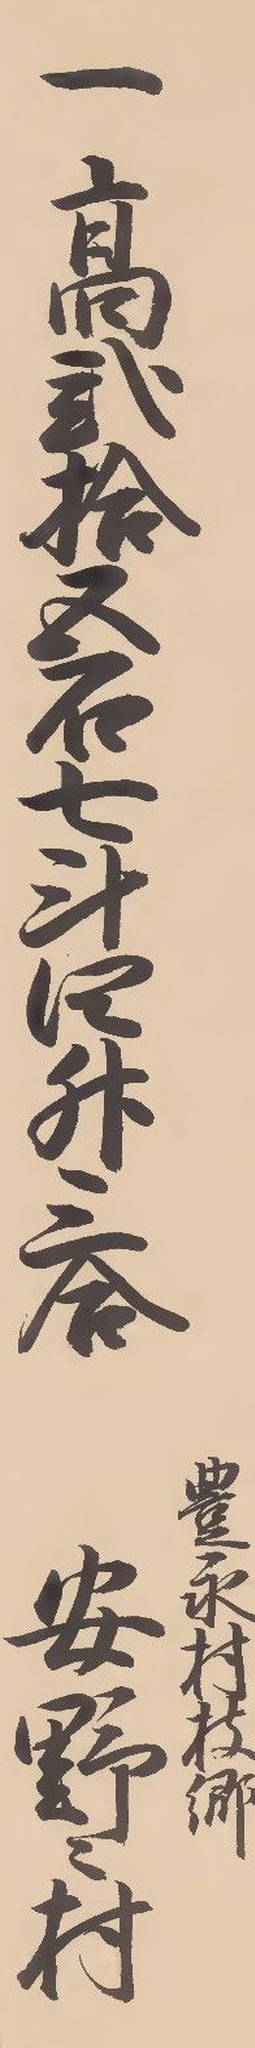一髙弐拾五石七斗四升三合安野々村
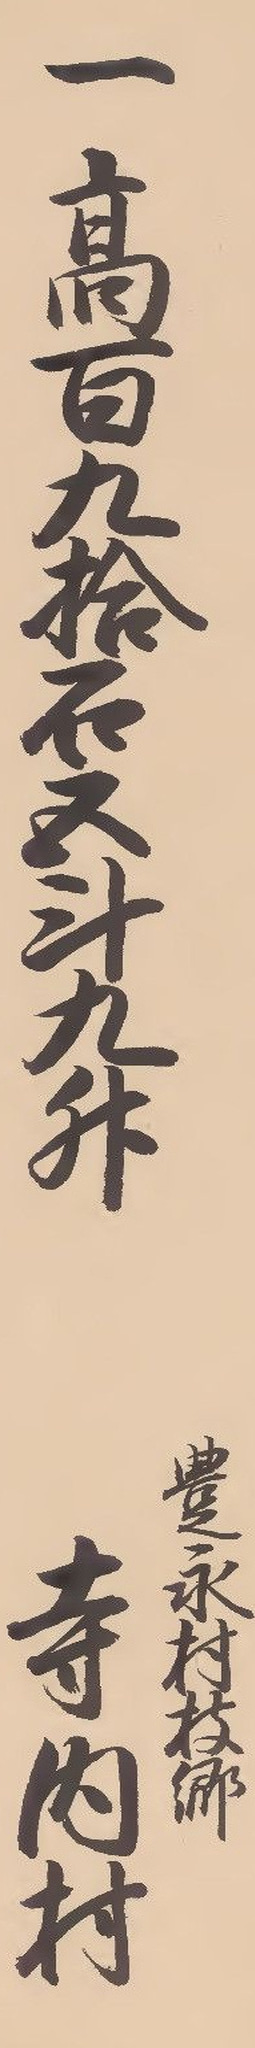一髙百九拾石五斗九升寺内村
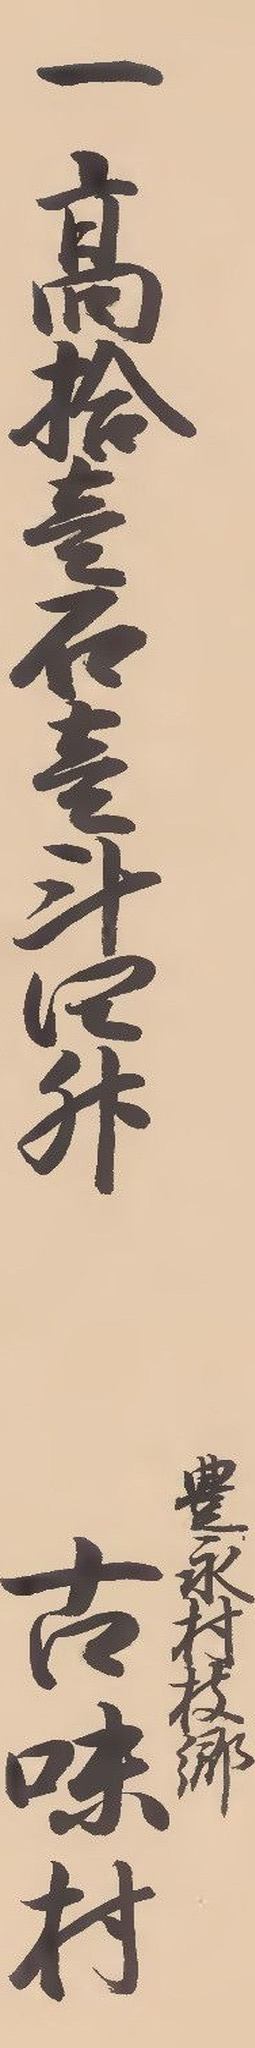一髙拾壱石壱斗四升古味村
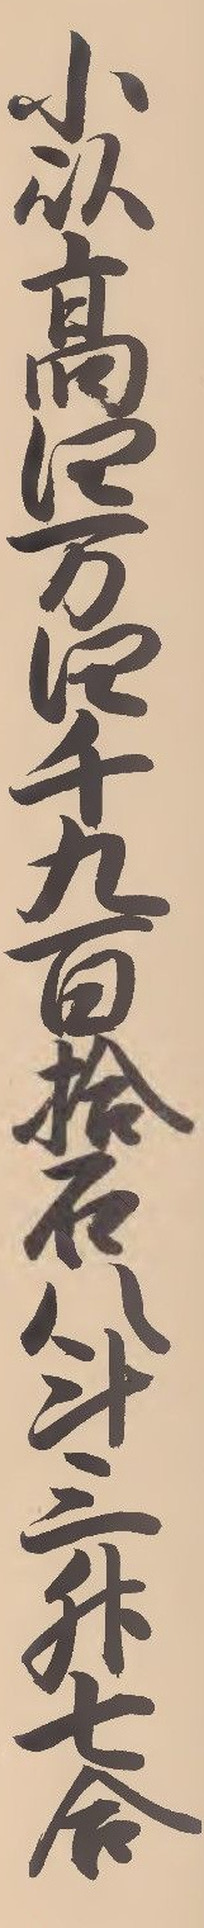小以髙四万四千九百拾石八斗三升七合

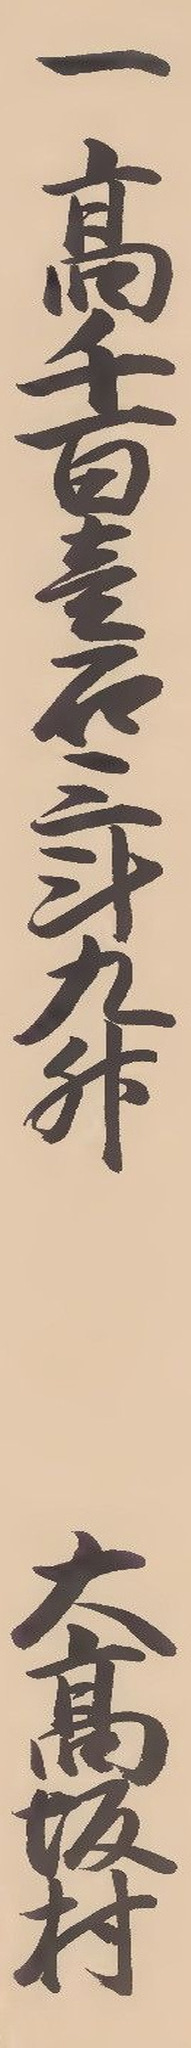一髙千百壱石三斗九升大髙坂村
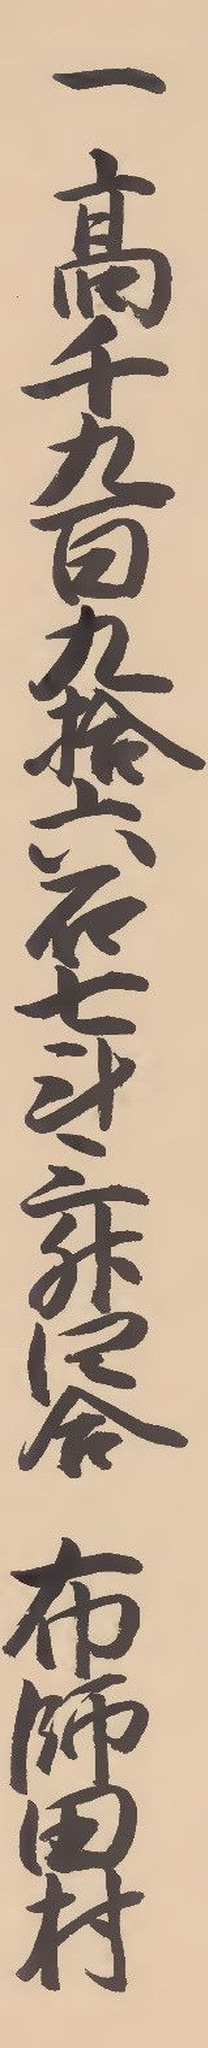一髙千九百九拾六石七斗三升四合布師田村
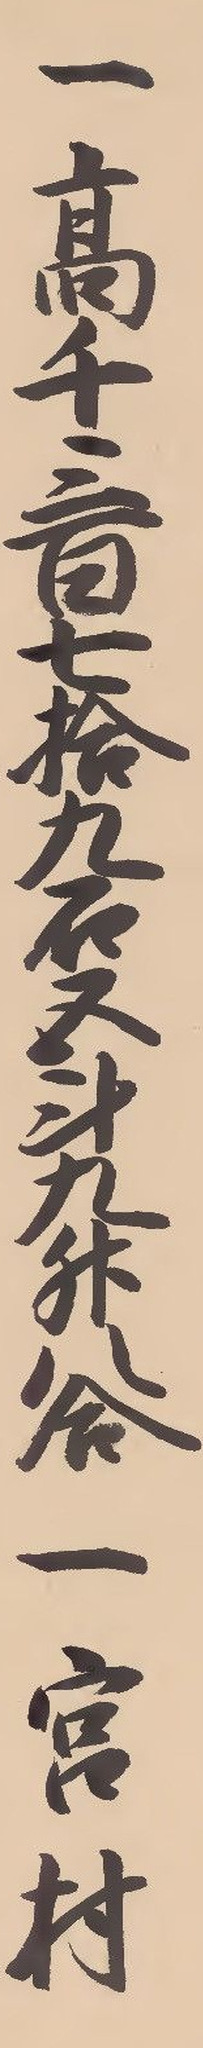一髙千三百七拾九石五斗九升八合一宮村
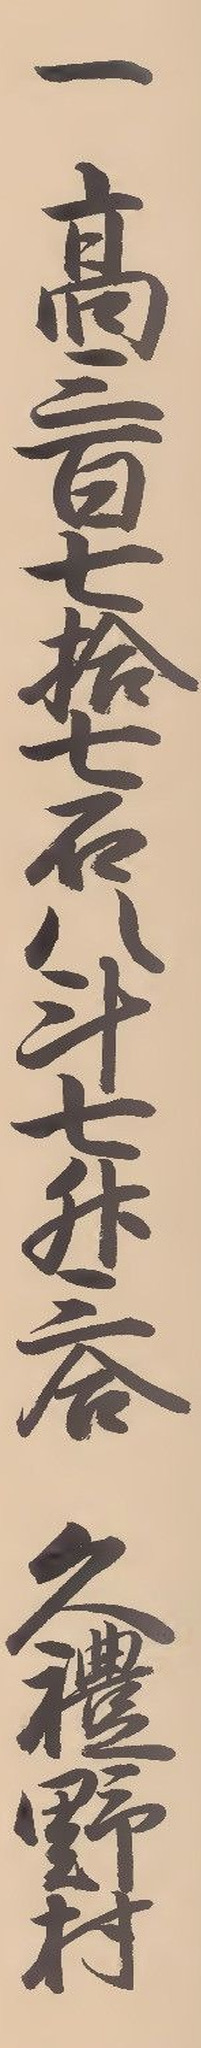一髙三百七拾七石八斗七升三合久禮野村
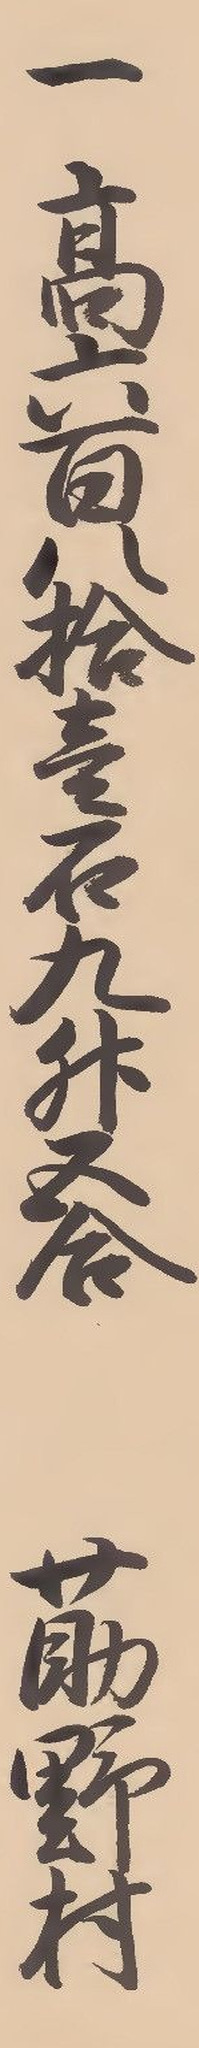一髙六百八拾壱石九升五合野村
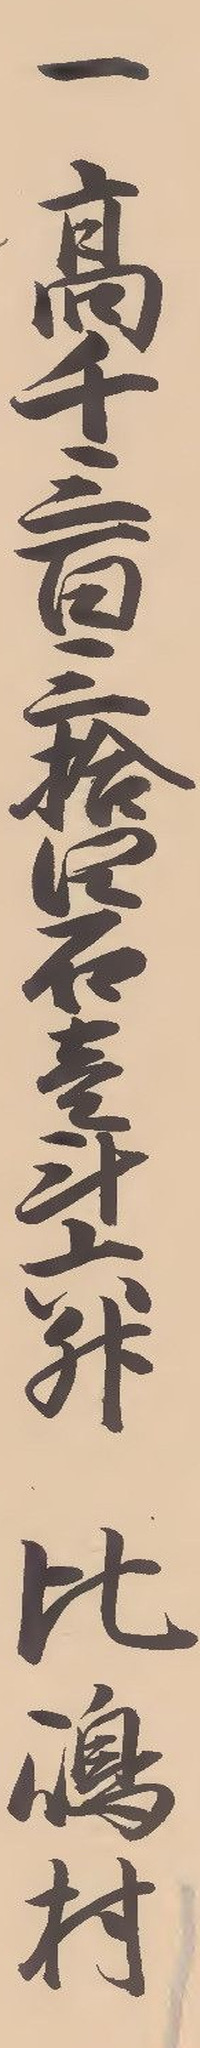一髙千三百三拾四石壱斗六升比嶋村
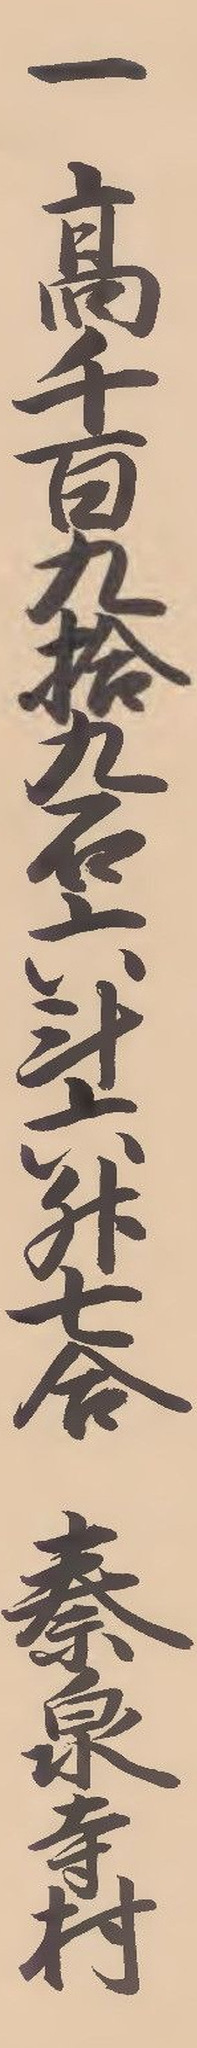一髙千百九拾九石六斗六升七合秦泉寺村

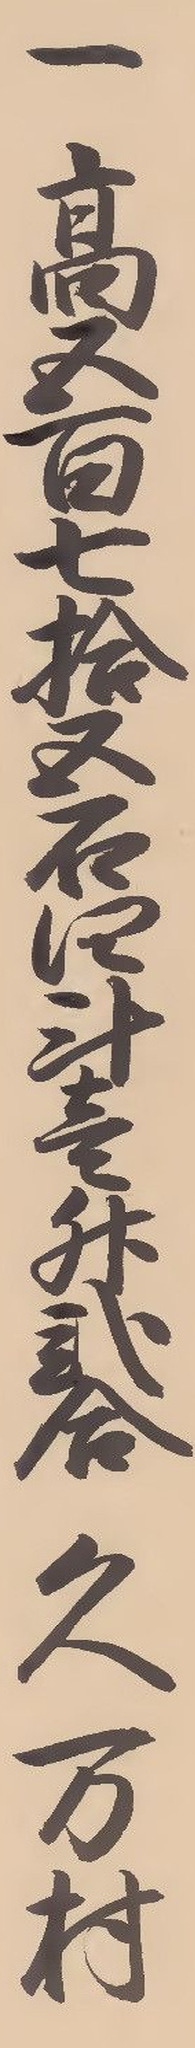一髙五百七拾五石四斗壱升弐合久万村
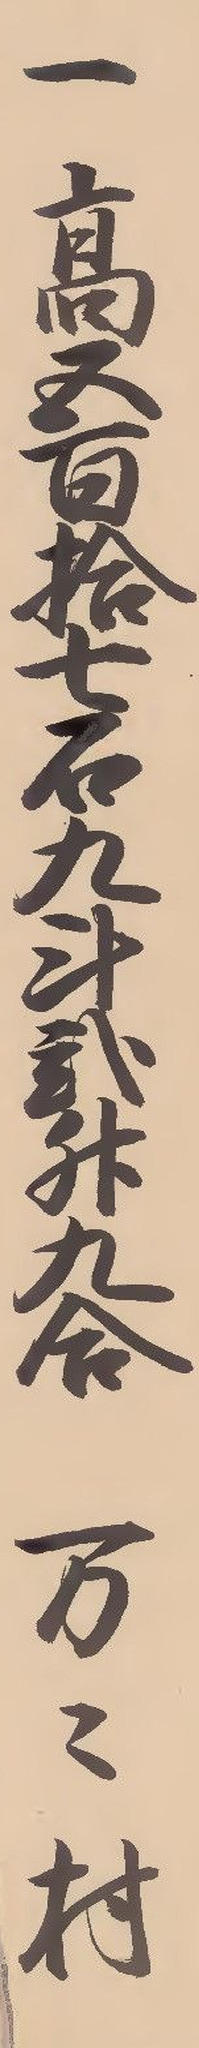一髙五百拾七石九斗弐升九合万々村
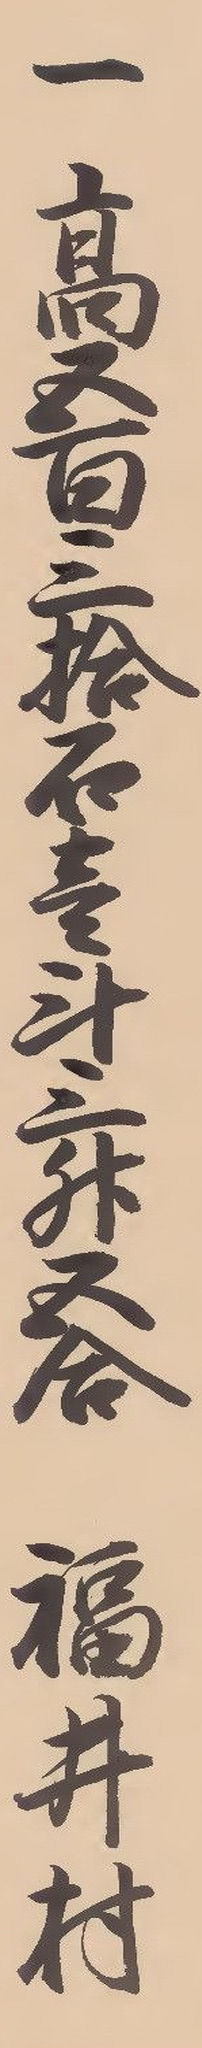一髙五百三拾石壱斗三升五合福井村
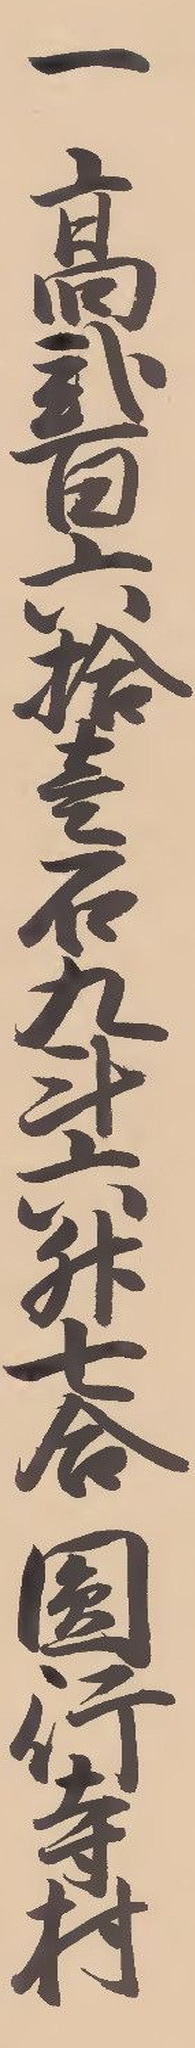一髙弐百六拾壱石九斗六升七合圓行寺村
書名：土佐国郷帳
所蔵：国立公文書館 National Archives of Japan
